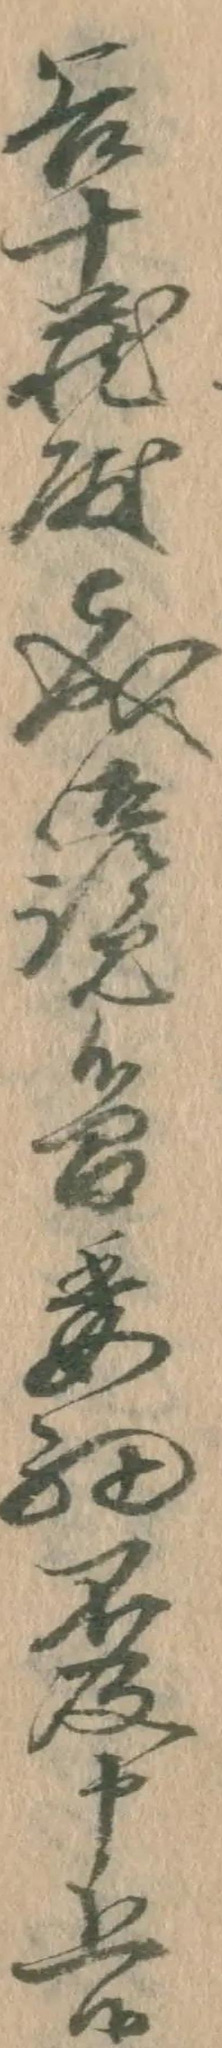谷十蔵殿被成御覧候間委細不及申上候
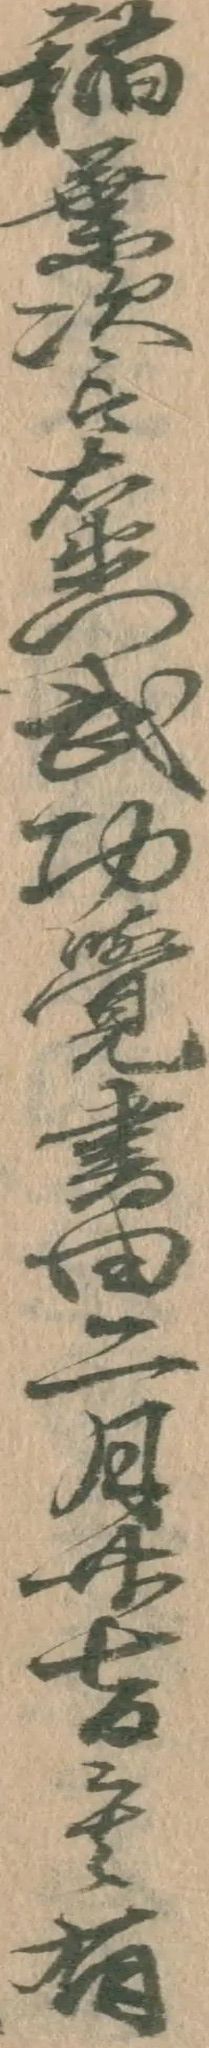稲葉次郎右衛門武功覚書曰二月廿七日に者有
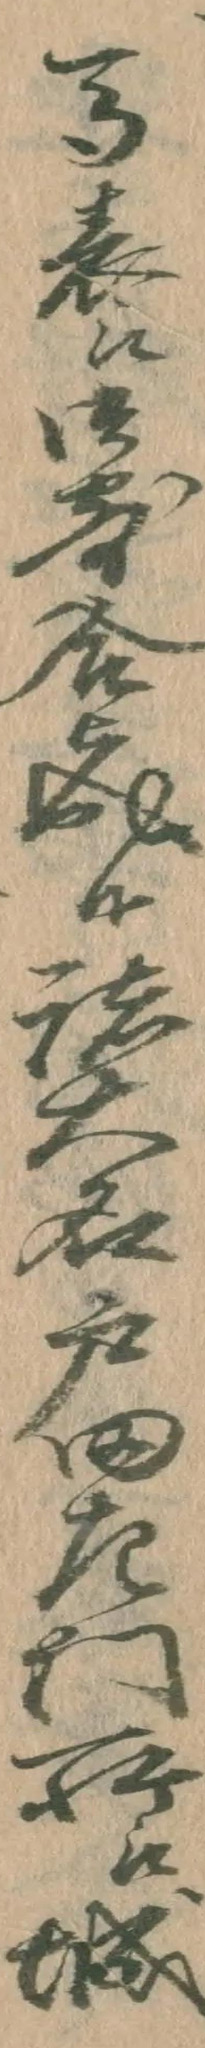馬表江御寄合被成候諸大名戸田左門所江城
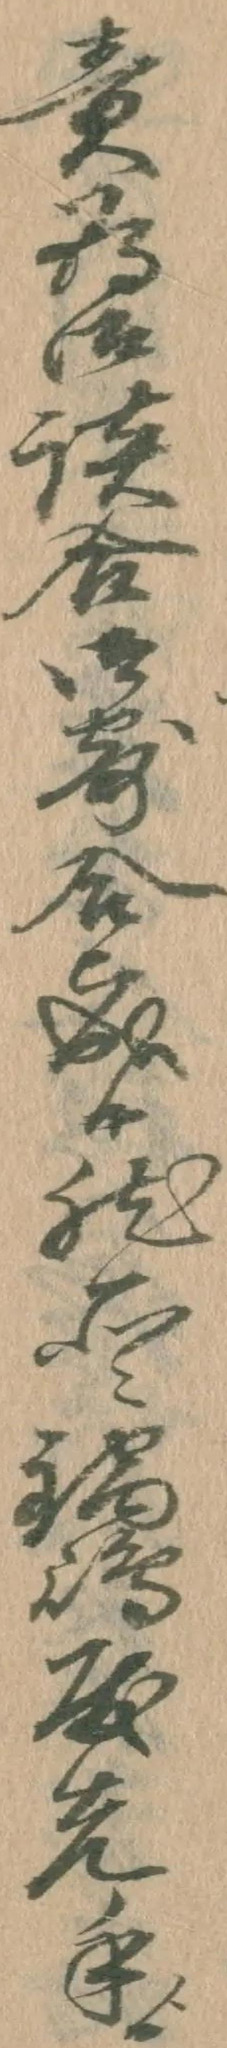責為御談合御寄合被成候然所に鍋島殿先手ゟ
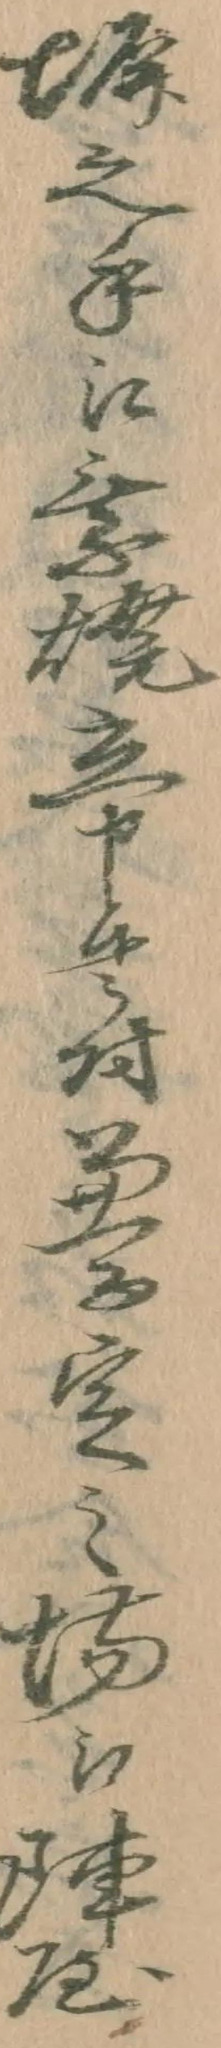塀之手江乗焼立申候に付兼而定之場江陣屋
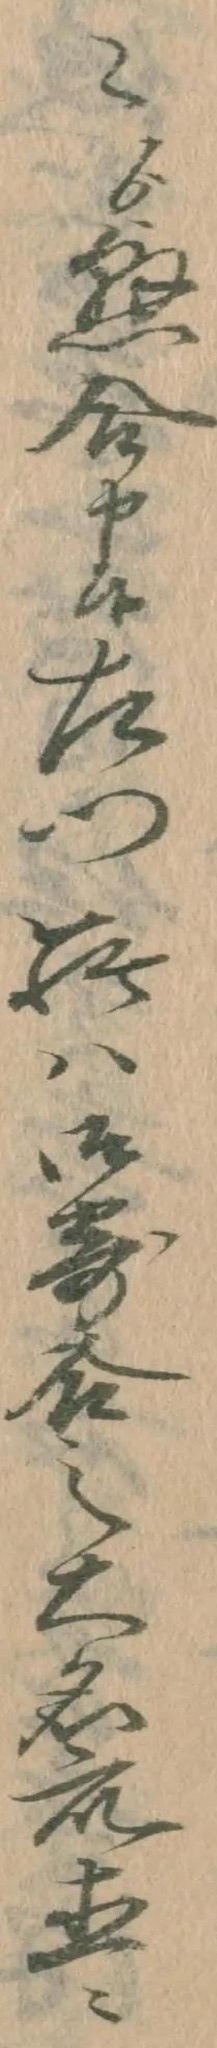にゟ懸合申候左門所は御寄合之大名衆直に
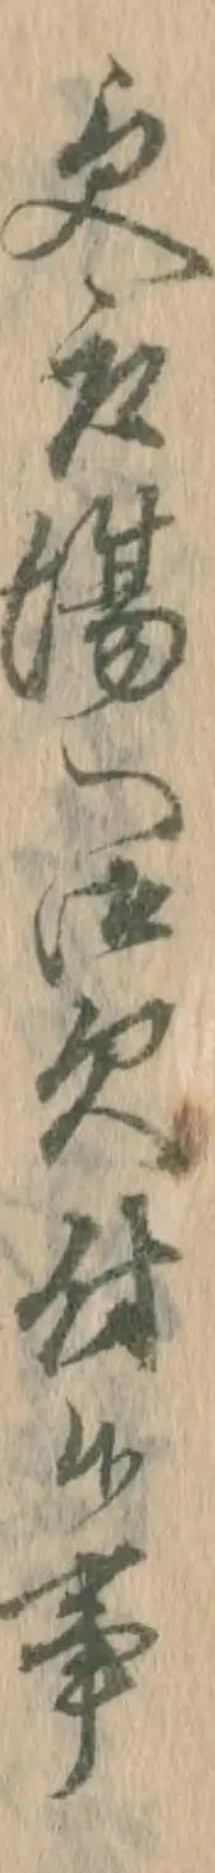受取場へ御欠付候事
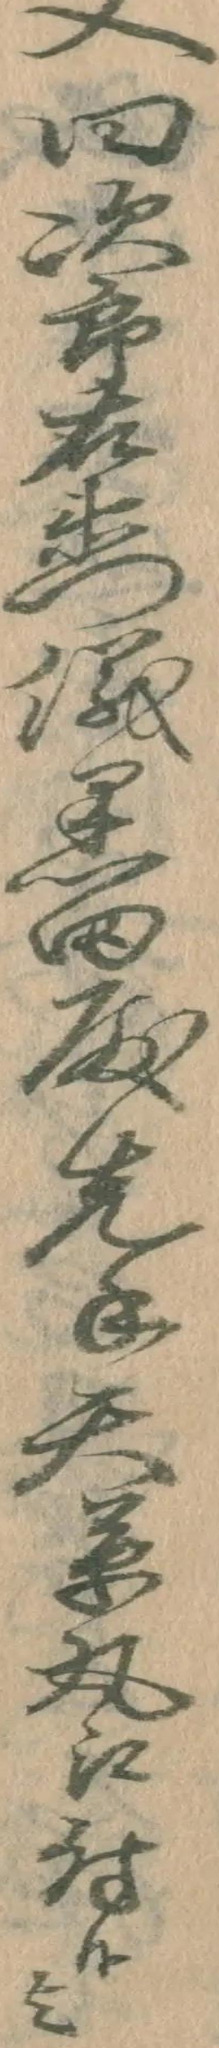又曰次郎右衛門儀黒田殿先手天草丸江付候与
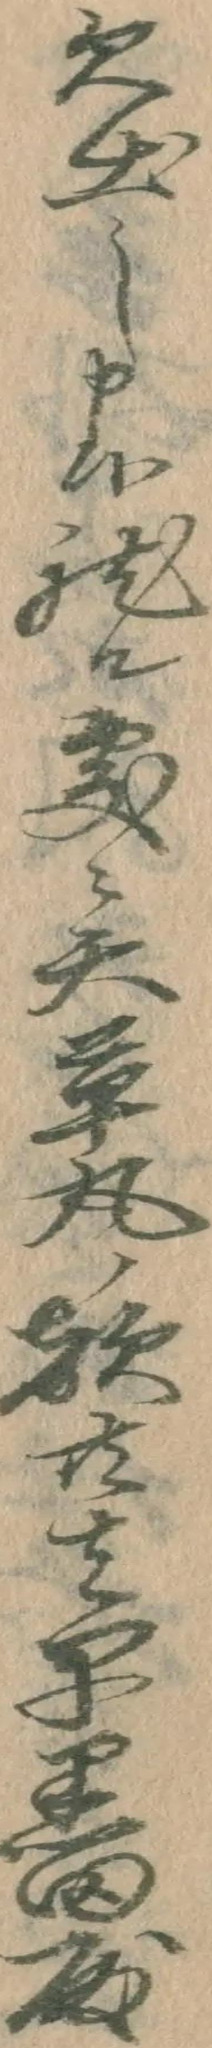欠出し申候然る處に天草丸之敵共者早黒田殿
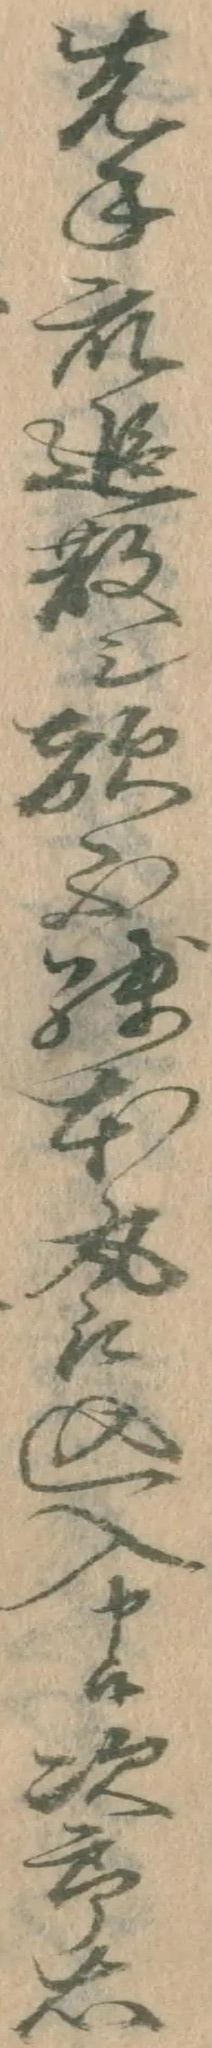先手衆追散し敵ふ残本丸江込入申候次郎右
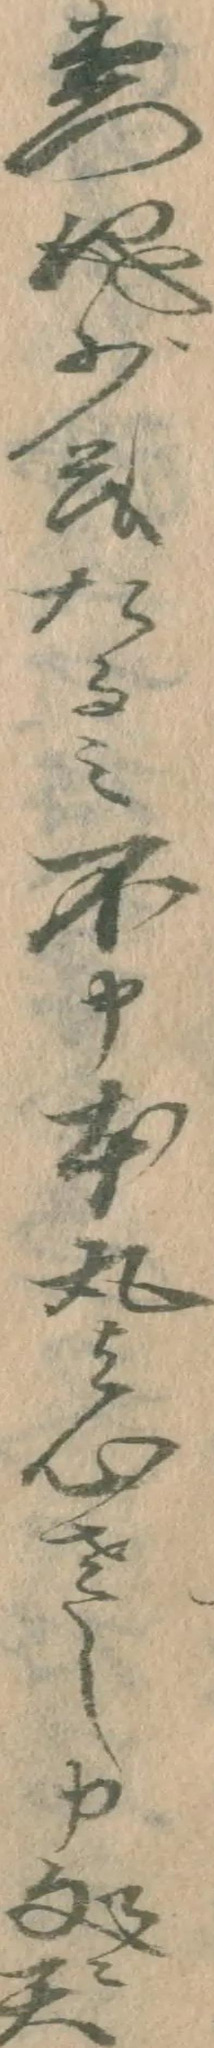衛門儀少茂たるみ不申本丸与心さし申処に天
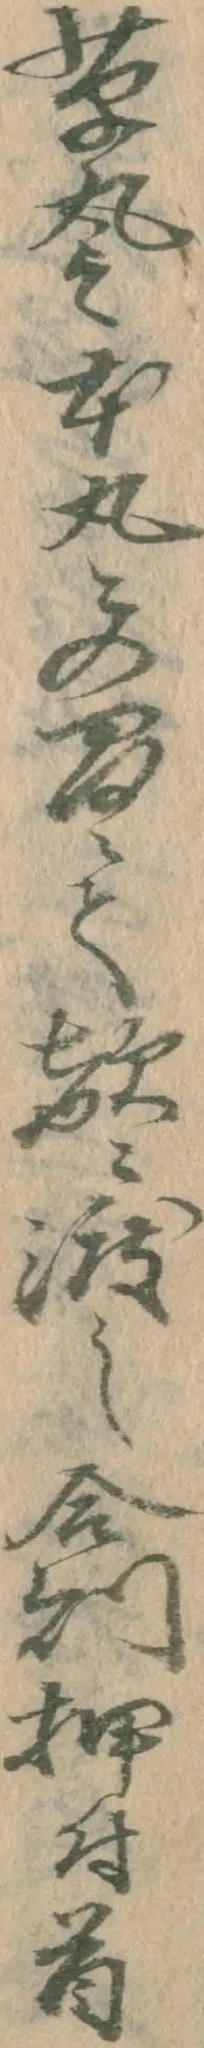草丸与本丸との間にて敵に渡し合則押付首
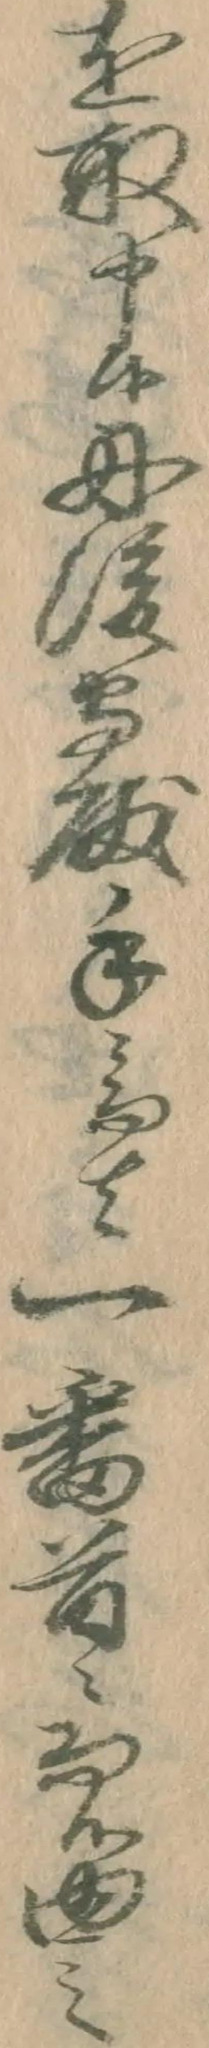を取申候丹後守殿手に而者一番首に而候由之

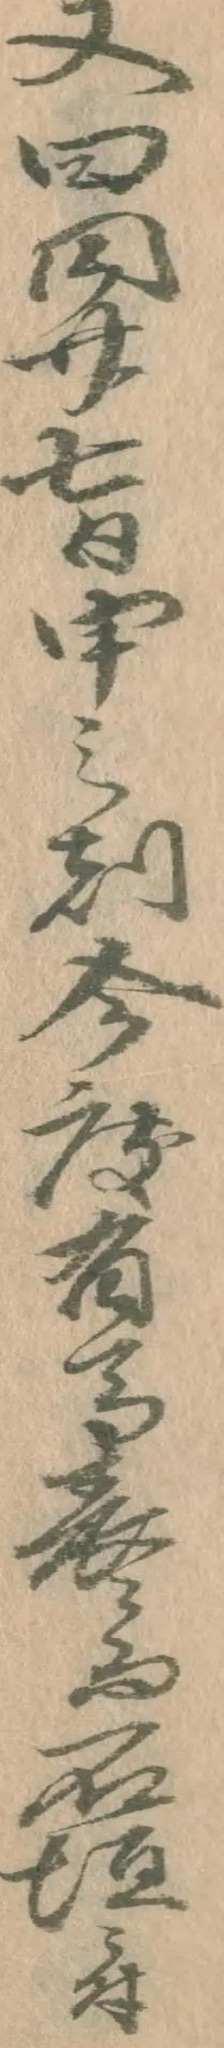又曰同廿七日申之刻今度有馬表に而石垣に付
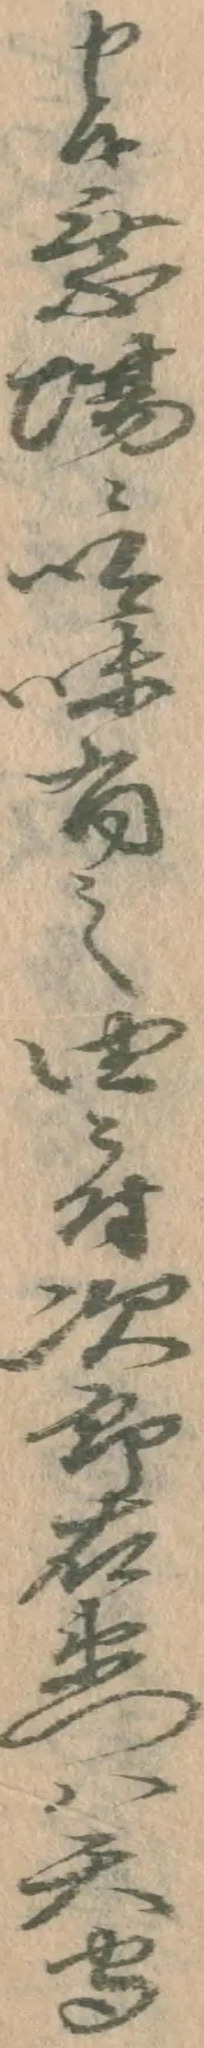申候乗場に吟味有之由に付次郎右衛門は天守
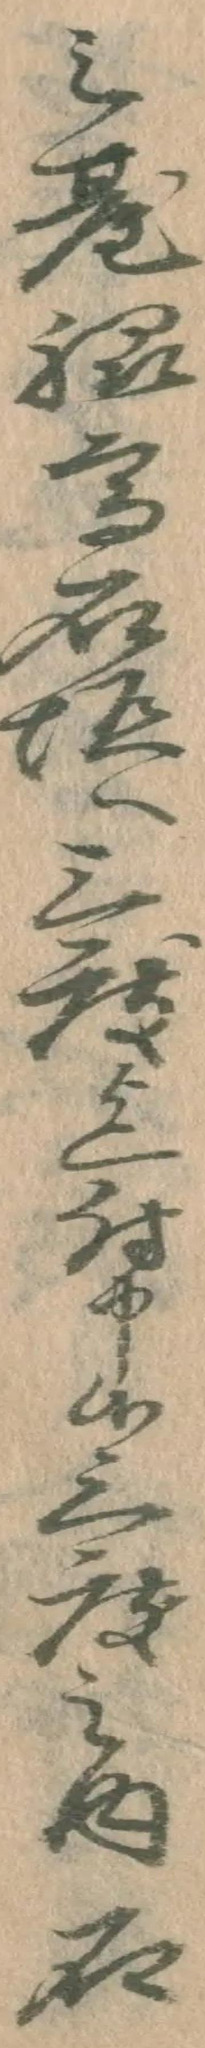之臺脇高石垣へ三度迄付申候三度之内石
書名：切支丹御退治記 49巻. [8]
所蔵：国立国会図書館 National Diet Library, JAPAN
